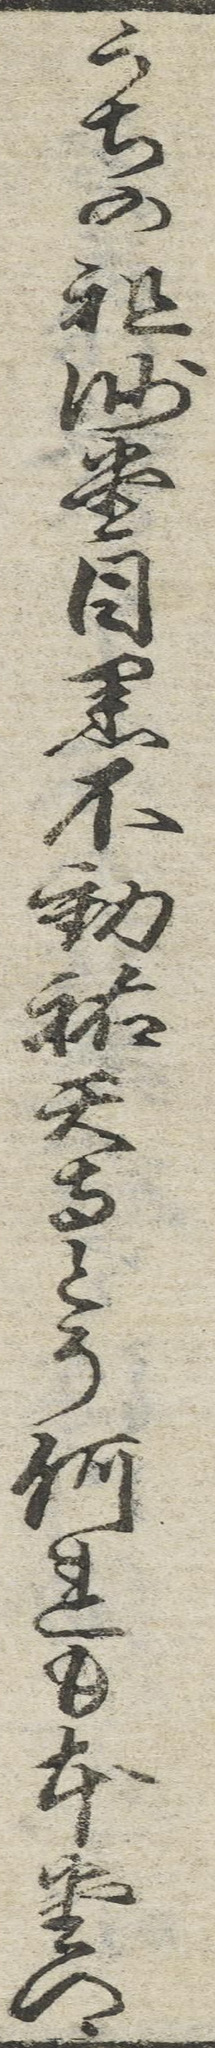うちの祖師堂目黒不動祐天寺とう何れも本堂つゝ
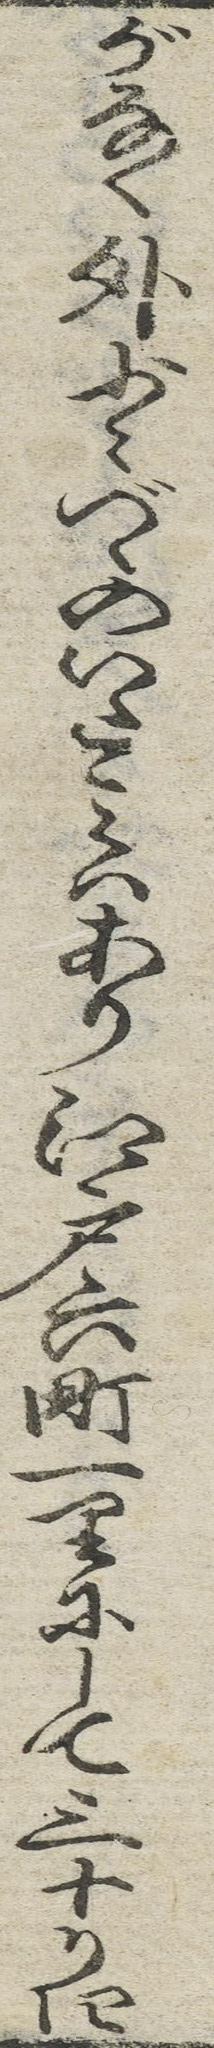がなく外少〻づゝのいたみはあり江戸六町一里にして三十り四
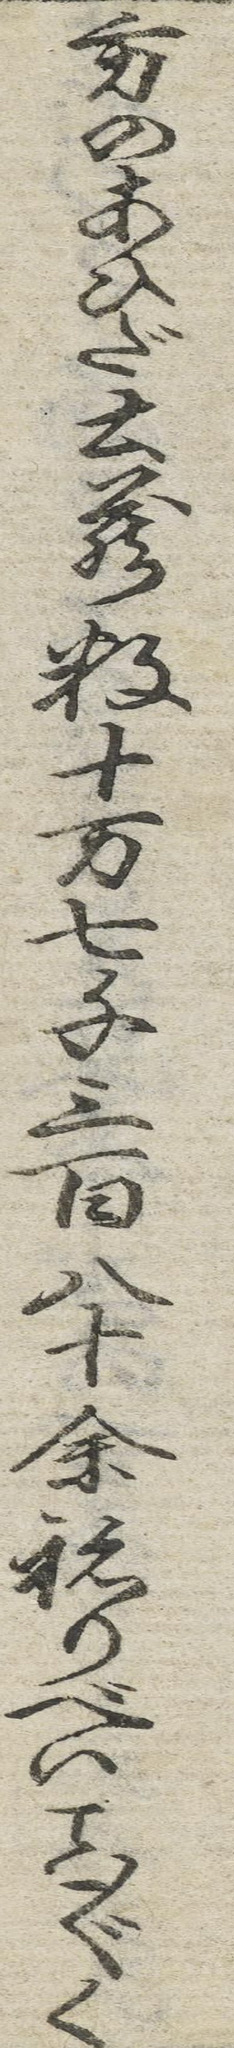方のあひだ土蔵数十万七千三百八十余ねりべいこと〴〵く
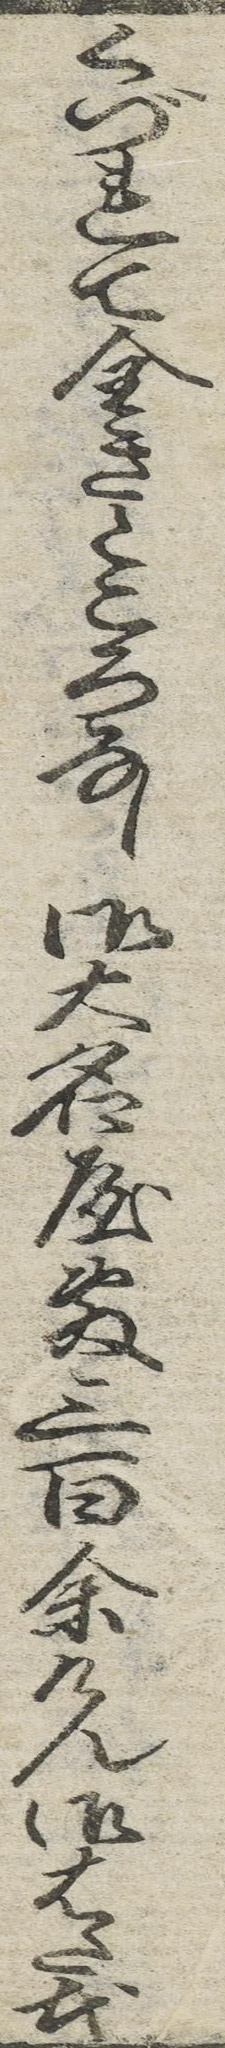くづれて全きところなし御大名屋敷三百余けん御はた本
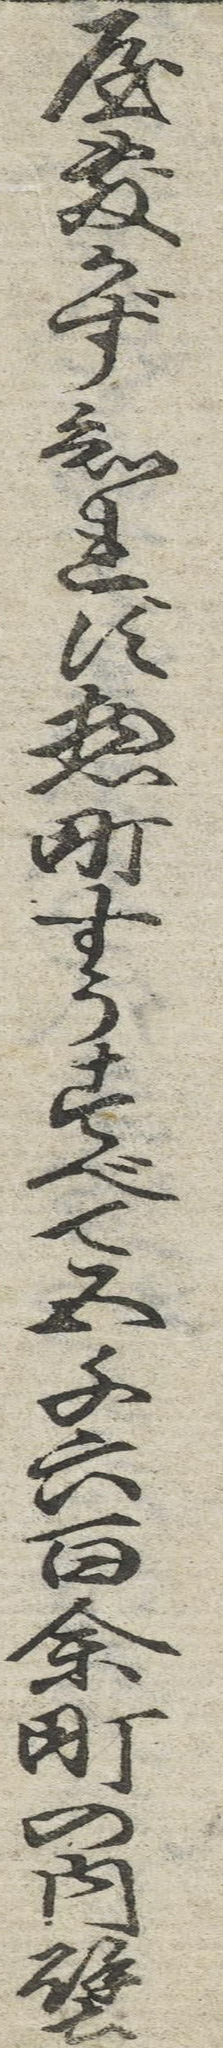屋敷かずしれず惣町すうすべて五千六百余町の内壁
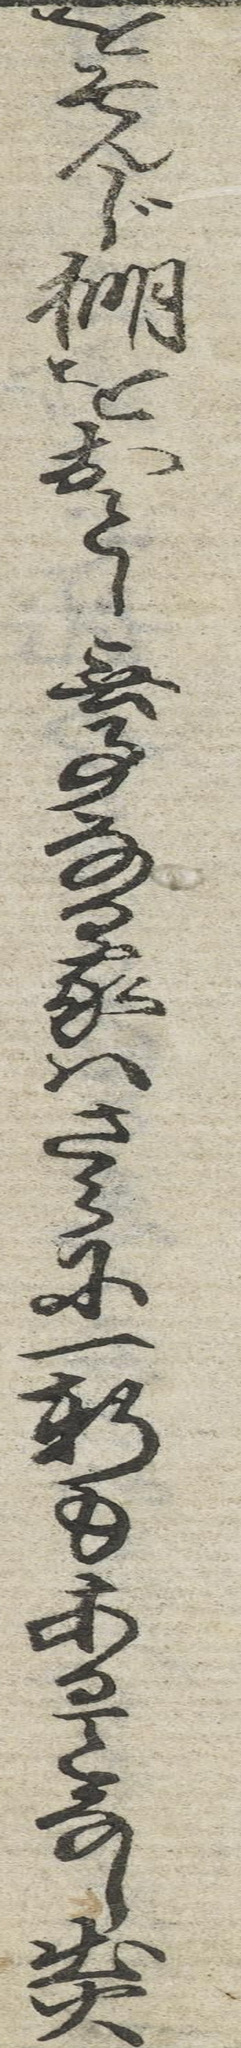をそんじ棚をおとし無事なる家はさらに一軒もあることなし出火
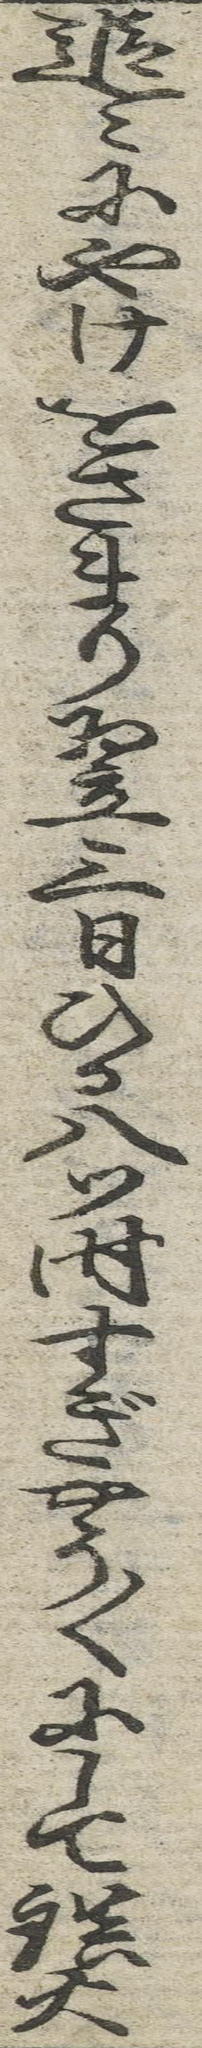追〻にやけをさまり翌三日ひる八つ時すぎやう〳〵にして鎮火
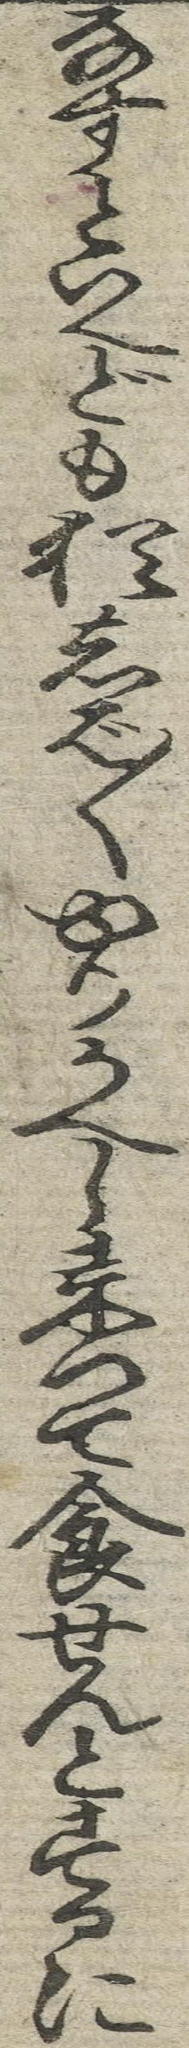なすといへとも猶しば〳〵ゆりかへし来つて食せんとするに

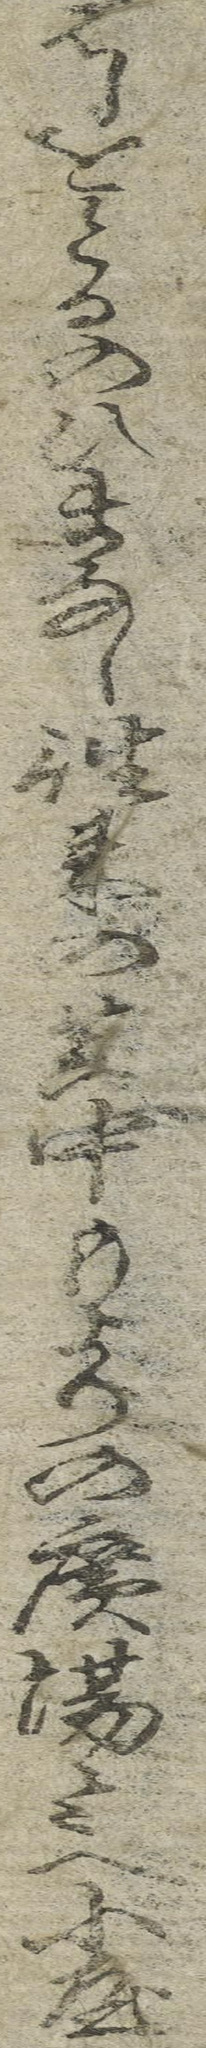はしをとるのひまなし往来の其中もよりの広場〻〻へ小屋
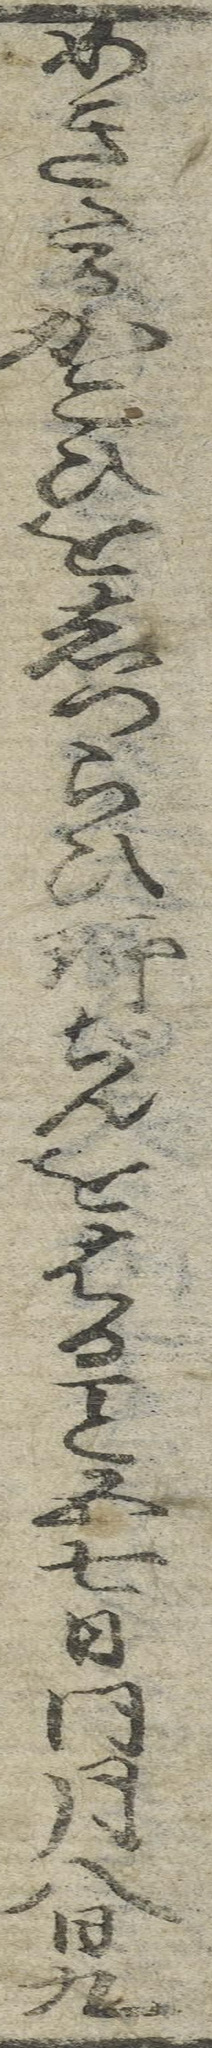めきたるかこひをしつらひ御ぢんをはること五七日同月八日九
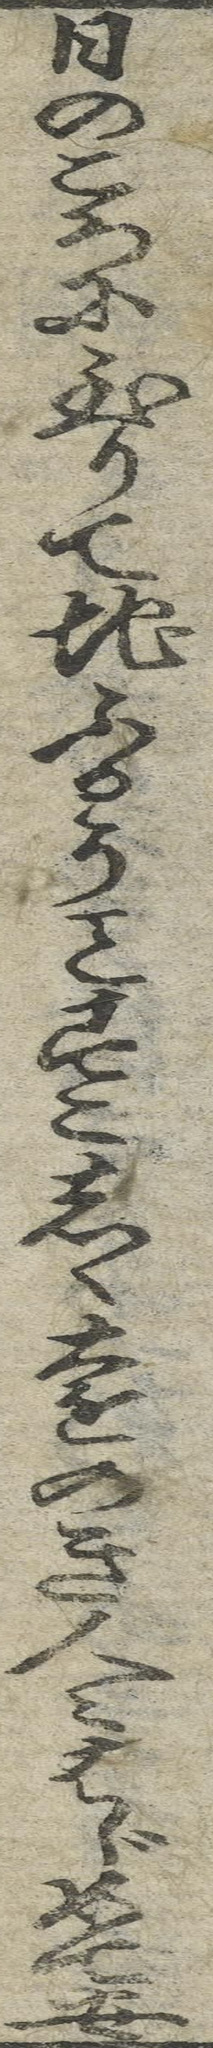日のころに至りて地ふるうことすこしく遠のき人〻はじめて安
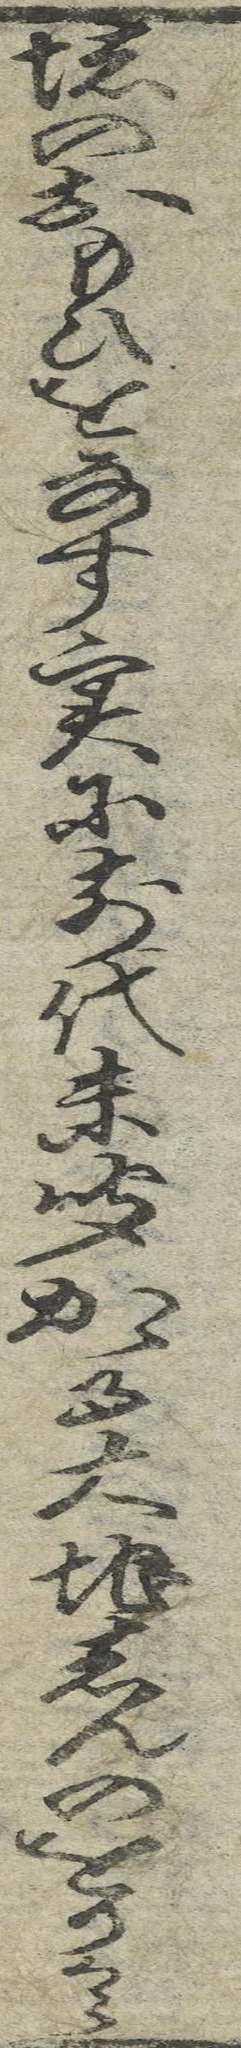堵のおもひをなす実に前代未聞かゝる大地しんのをりから
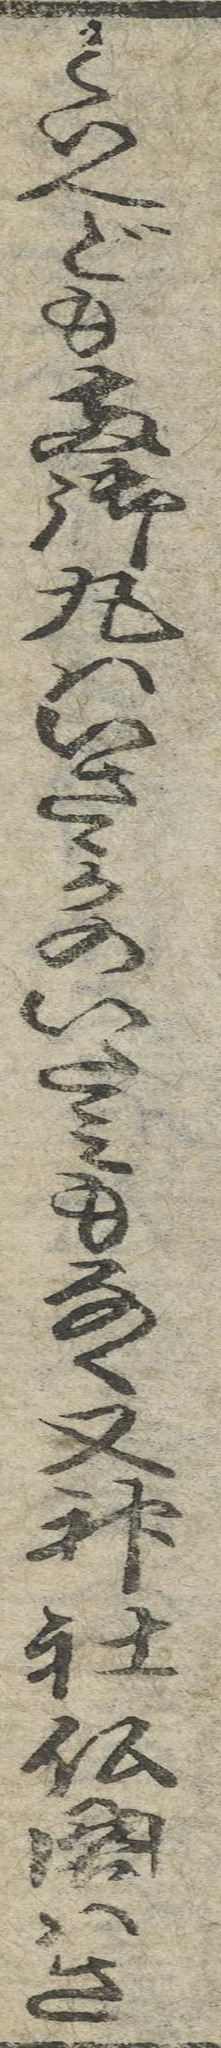といへども両御丸はいさゝかのいたみもなく又神社仏閣はさ
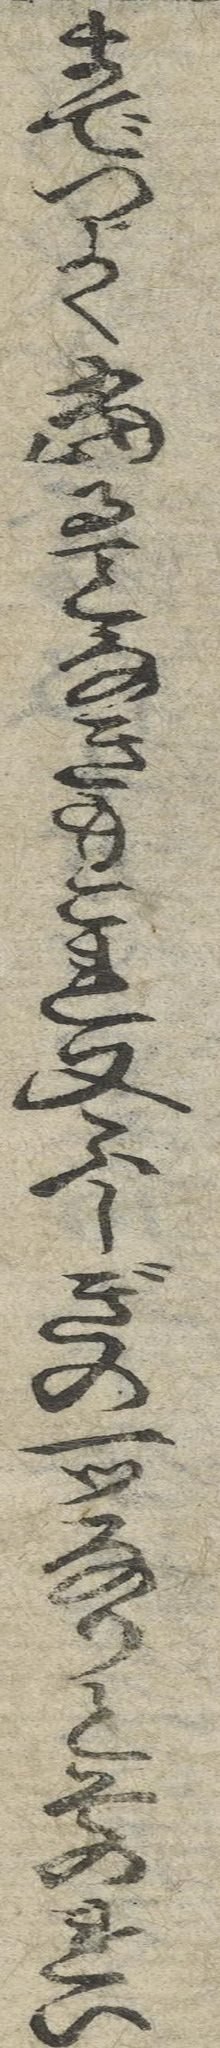までつよく当ることなきものこれ又ふしぎの一つなりとそのれい
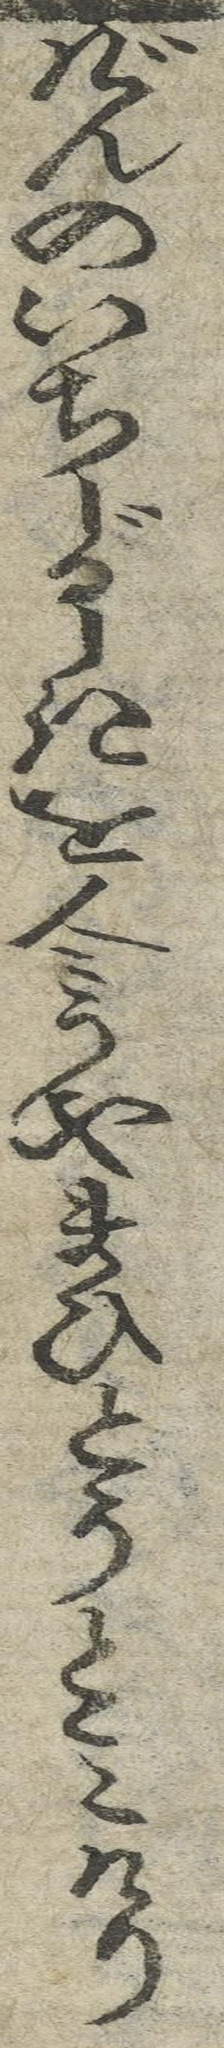げんのいちじるしきを人〻うやまひとうとみけり
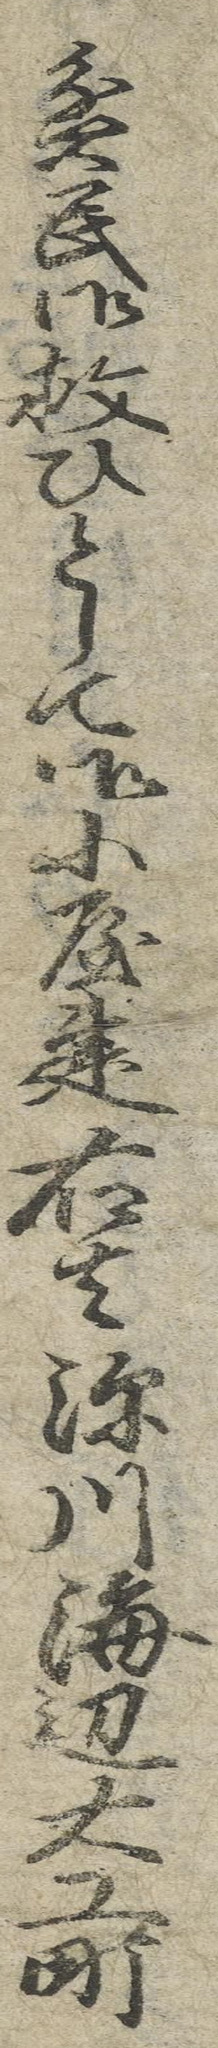貧民御救ひとして御小屋建右は深川海辺大工町
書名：関東　大地震細記
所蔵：東京大学地震研究所図書室 Earthquake Research Institute Library, The University of Tokyo, JAPAN
